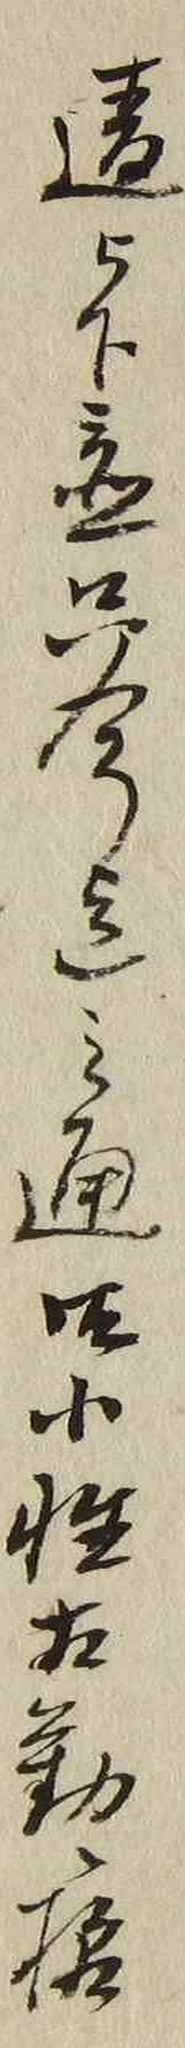違被下置只今迄之通御小性相勤候様
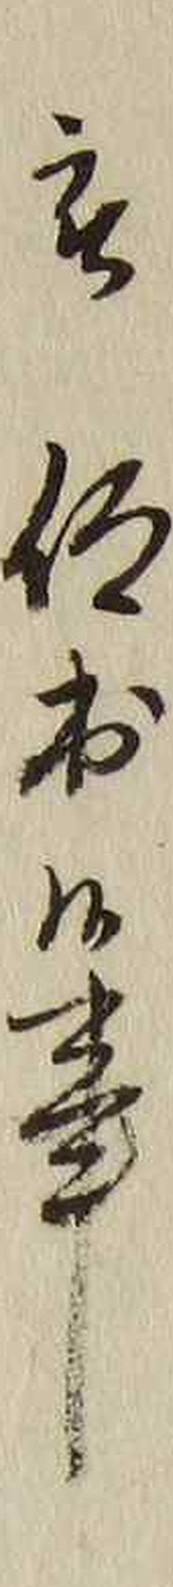被仰出候事
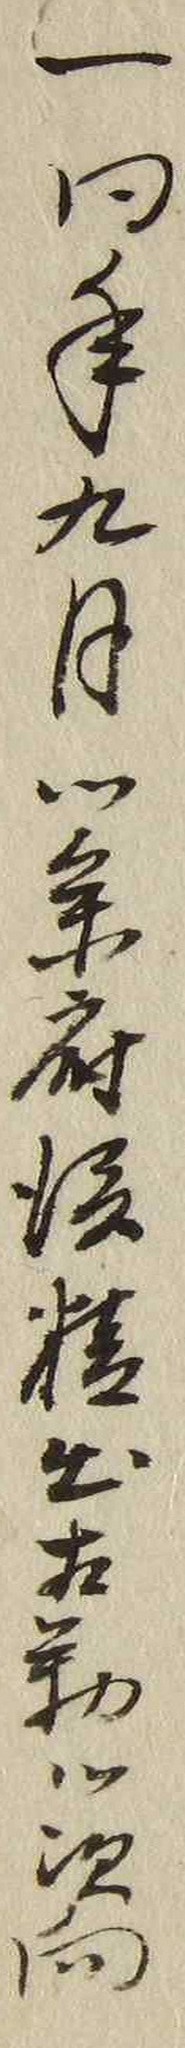一同年九月御参府後精出相勤御次向
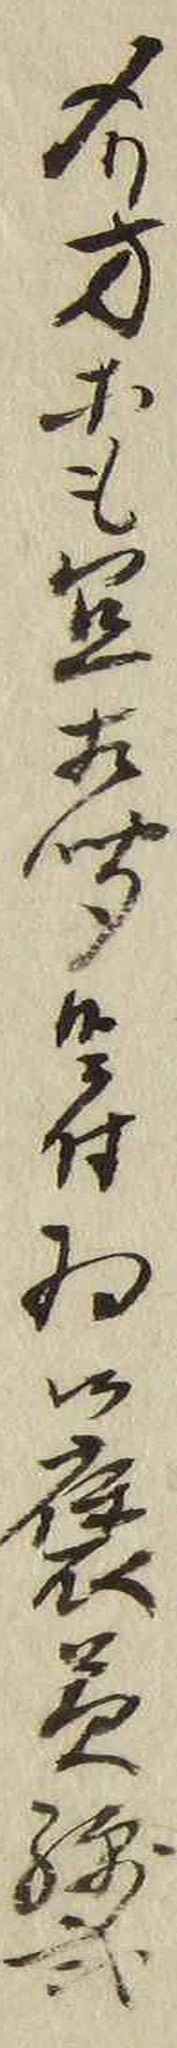〆り方等も宜相聞候ニ付為御褒美綿弐

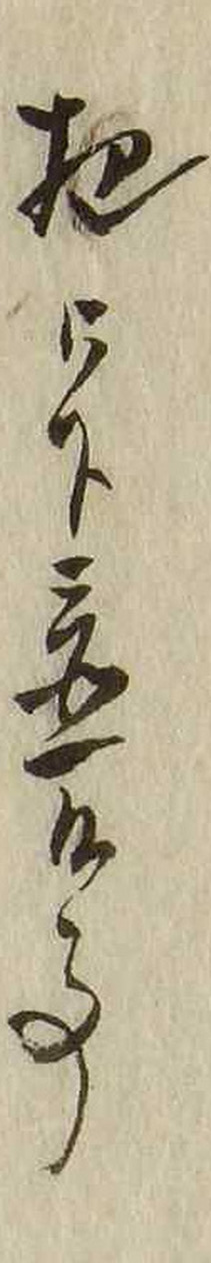把被下置候事
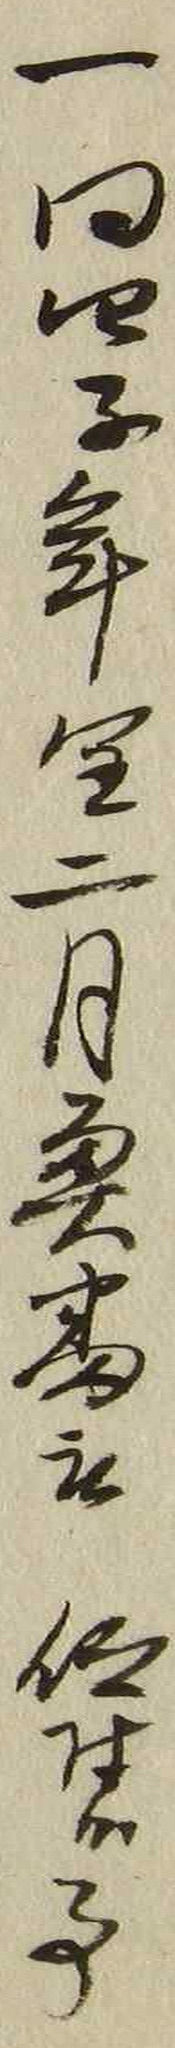一同四子年閏二月奥番被仰付候事
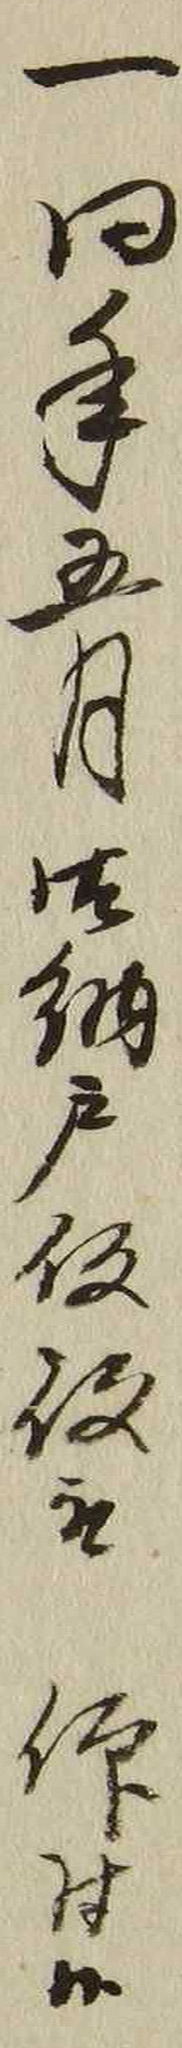一同年五月御納戸仮役被仰付候
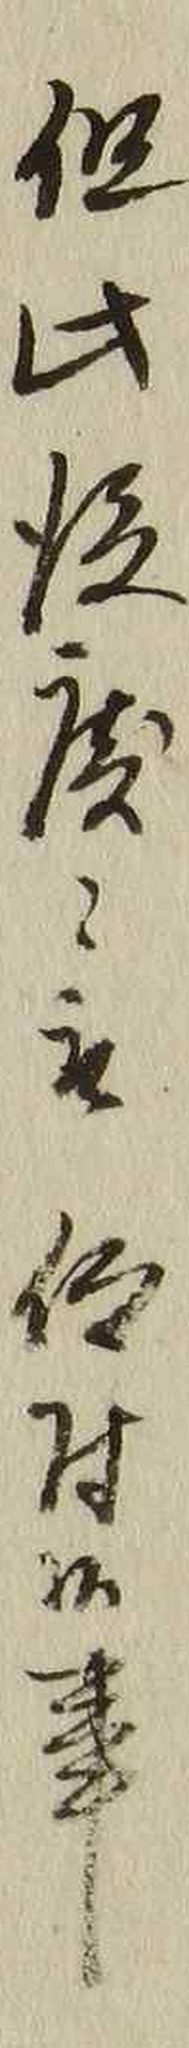但此後度々被仰付候事
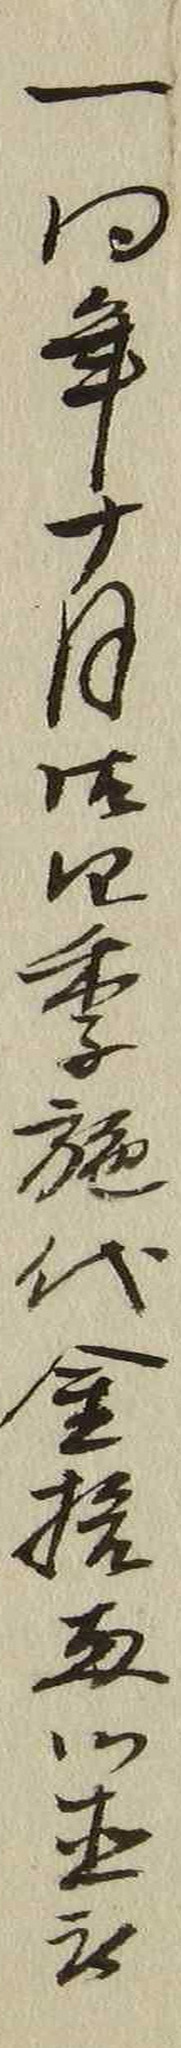一同年十月御四季施代金拾両御直被
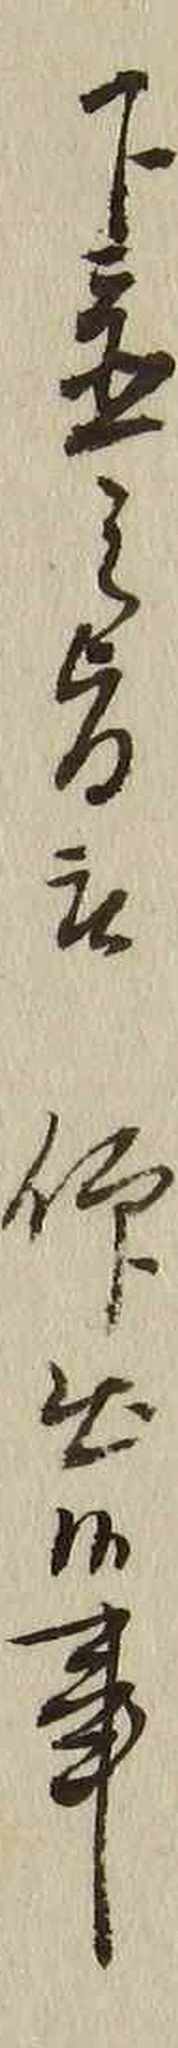下置之旨被仰出候事
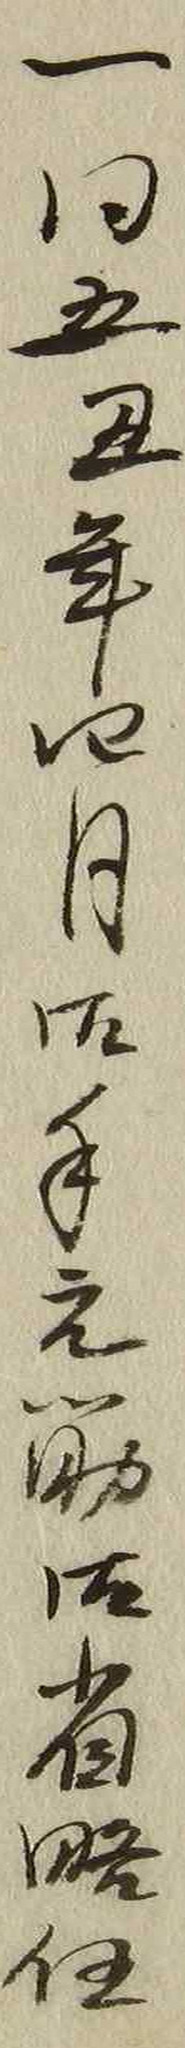一同五丑年四月御手元筋御省略任
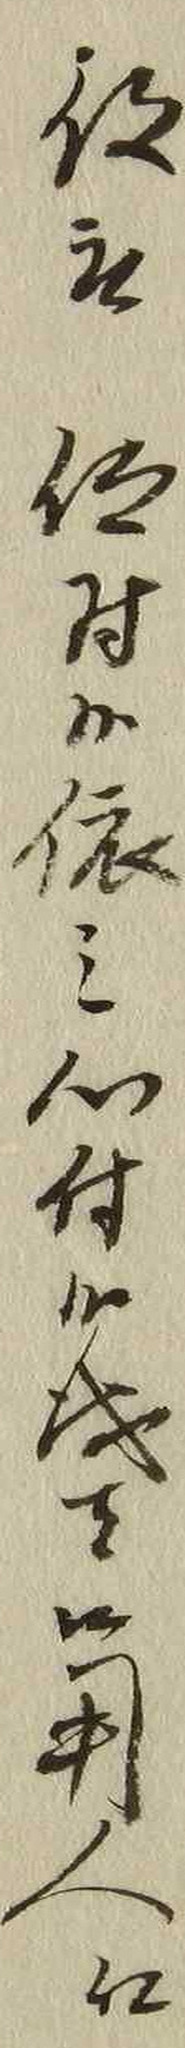役被仰付候依之心付候儀者御用人江
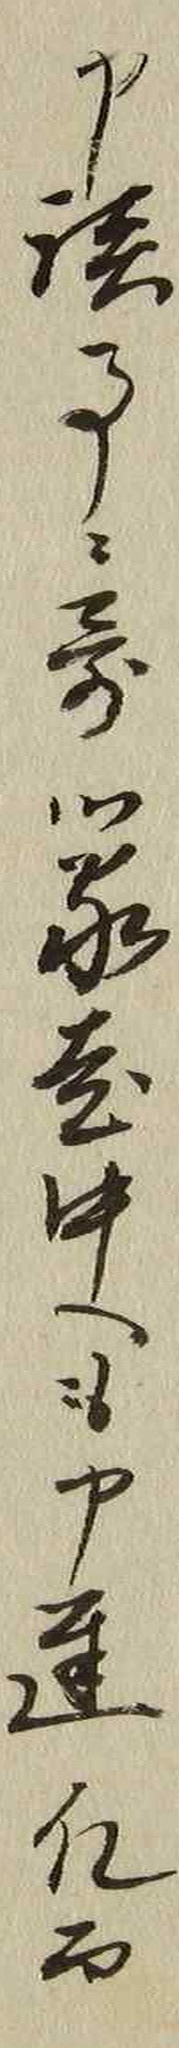申談事ニ寄御家老中へも申達凡而
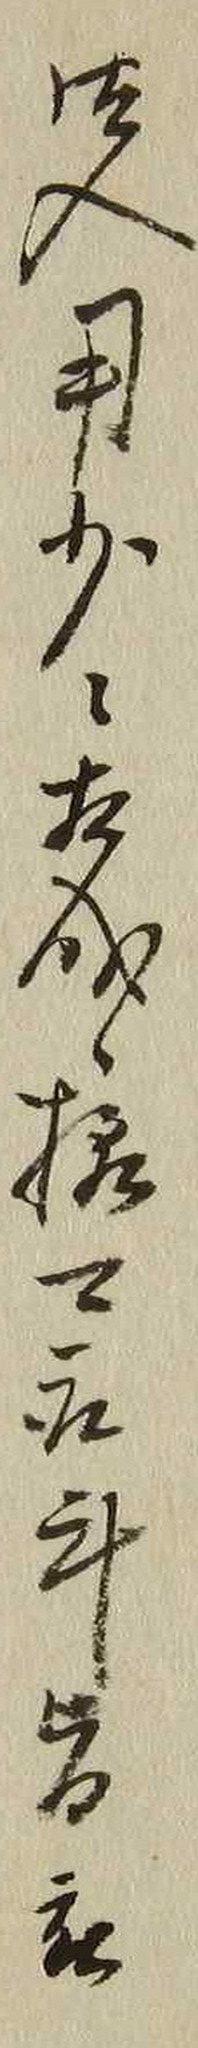御人用少ニ相成候様可取計旨被
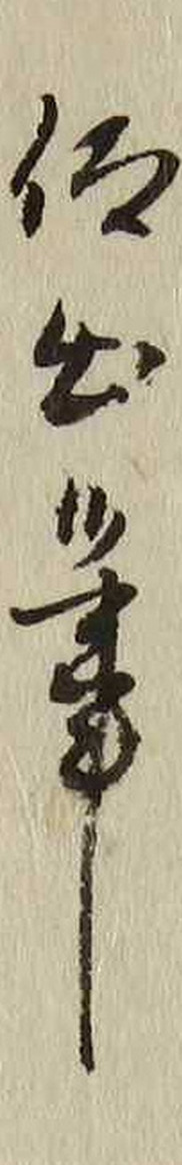仰出候事
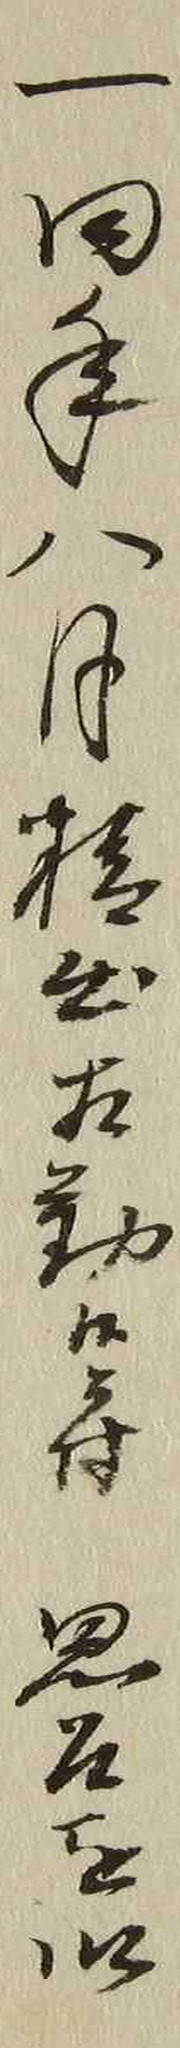一同年八月精出相勤候ニ付思召を以
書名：諸士系譜　巻之359　す之部9
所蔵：会津若松市立会津図書館
